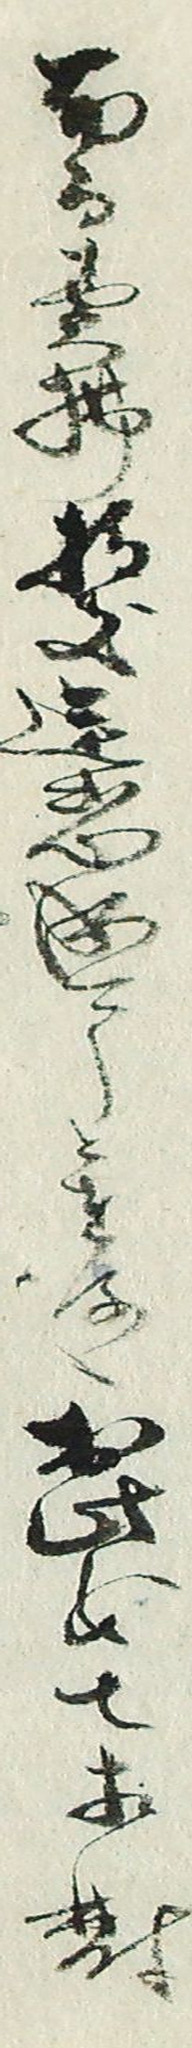却而売払指支迷惑成可申と奉存候於此義者相対
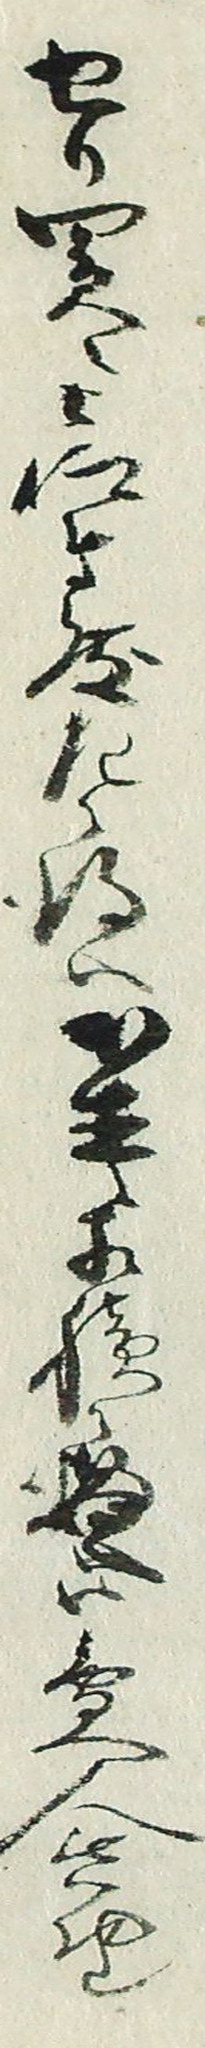せり買に被仰付度左候得は下直に相積候者へは売人無御坐
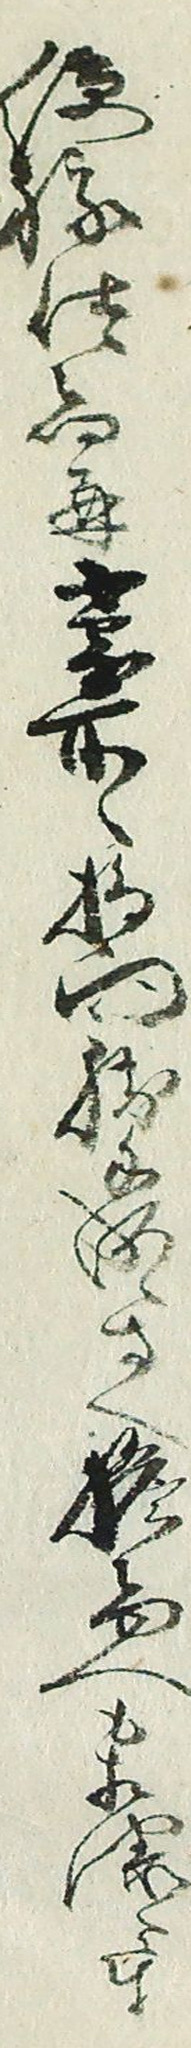絞稼仕候者再小寄所へ指向勝手成候方へ担商人も相湊候に付
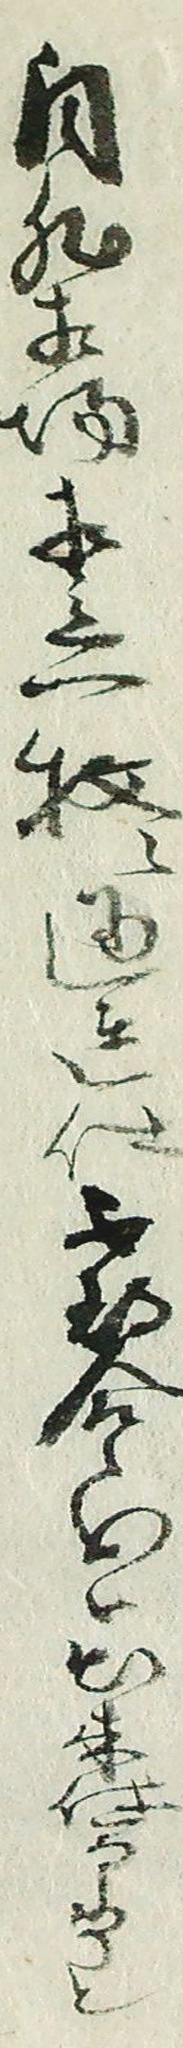自然相場相立一牧に通達仕不都合之義も出来仕間布と
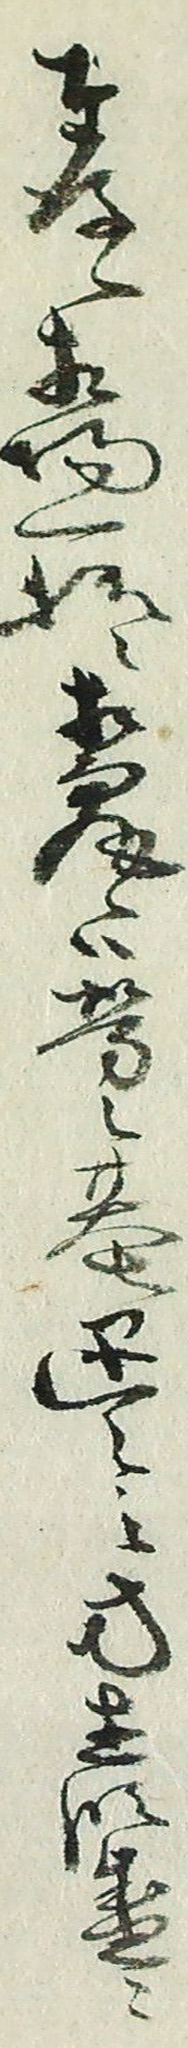奉存候相場一様に相究候は労之基区々之方直段盡々
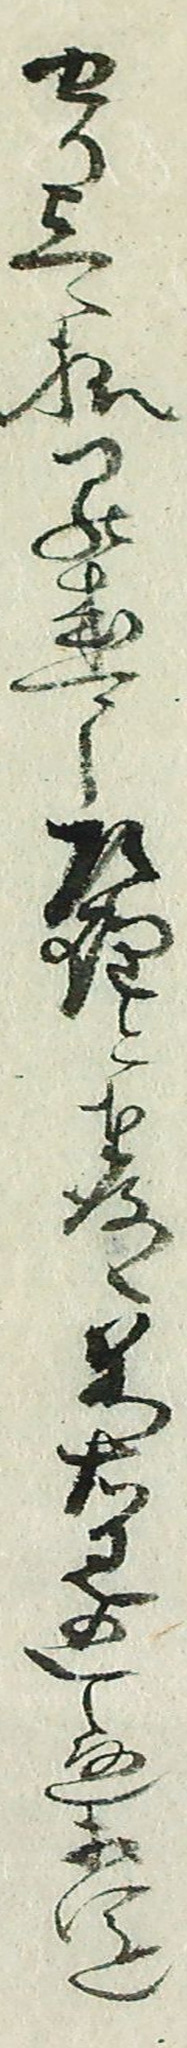せり上候様罷成可申道理と奉存候若右見込之通相運
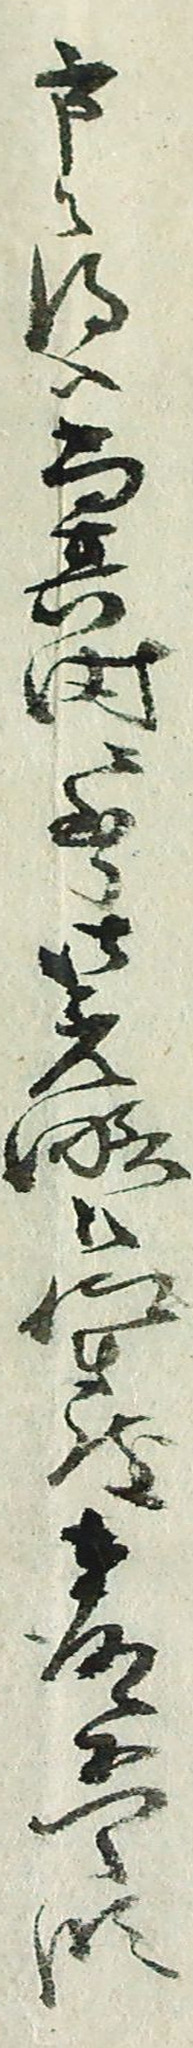不申候得者は尚其時に至り御差略被仰付度奉存候右之段
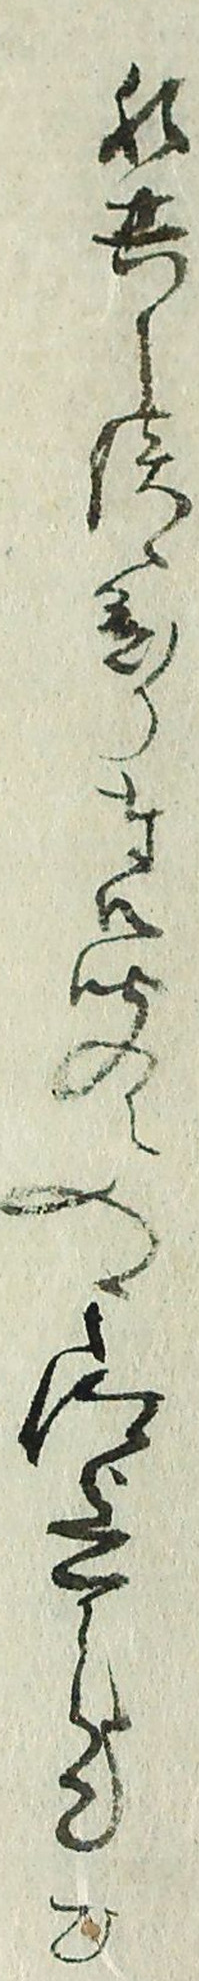私共申談候邊り奉御聞に入被仰上可被下候以上
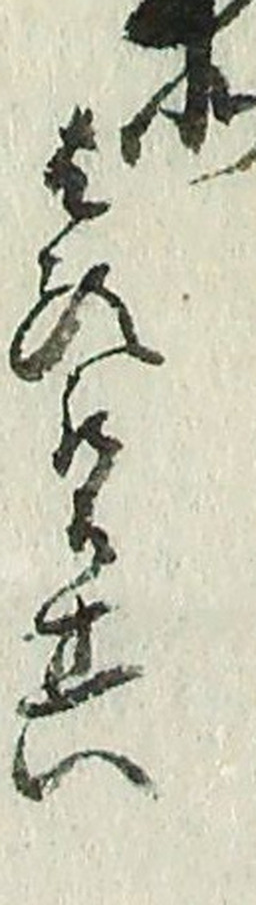与頭庄屋共
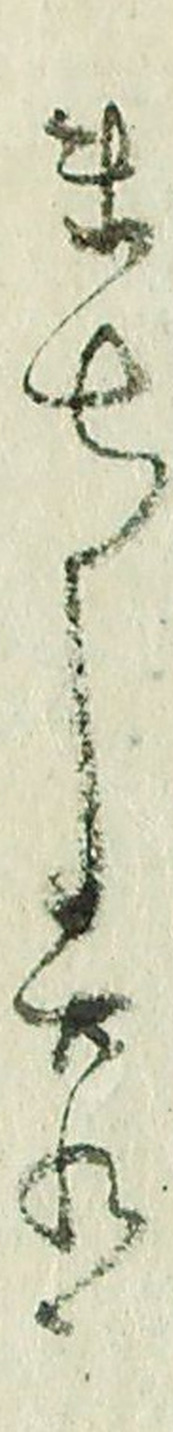未七月廿九日
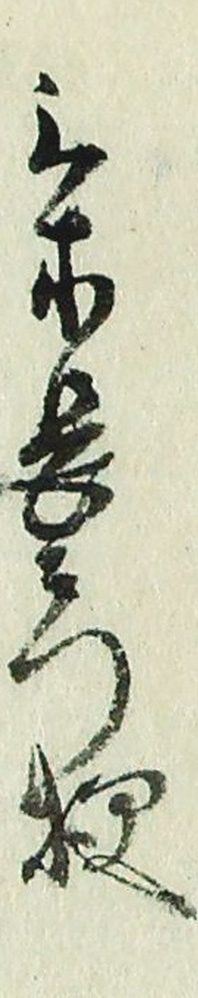三木長左衛門様
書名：油稼御取究ニ附御箇條書テ以被仰渡南北同役申談御答書控
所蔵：鳴門教育大学 Naruto University of Education
